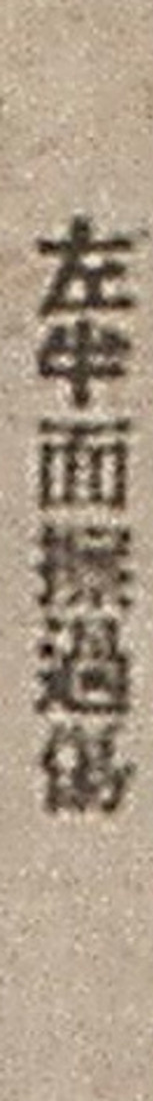左半面擦過傷
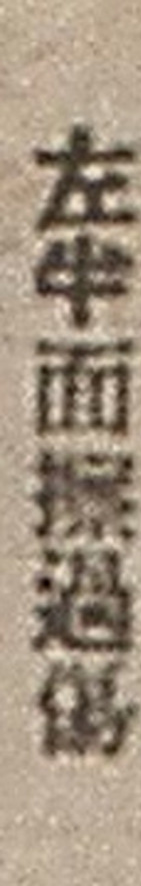左半面擦過傷
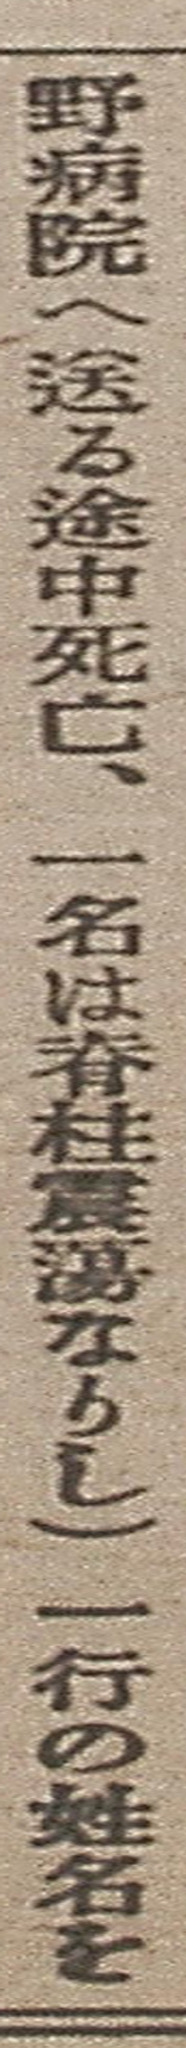野病院へ送る途中死亡、一名は脊柱震蕩なりし）一行の姓名を
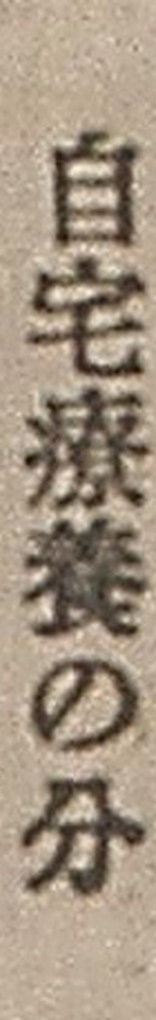自宅療養の分
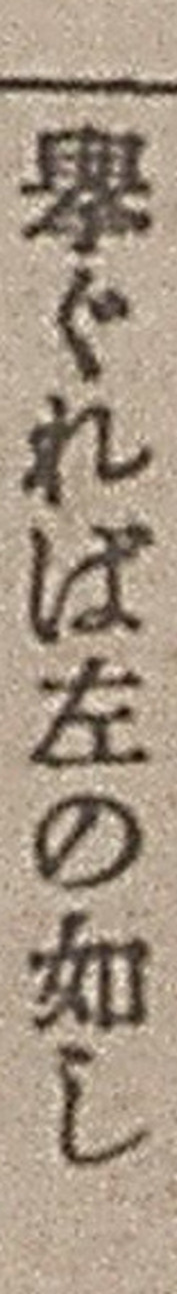挙ぐれば左の如し
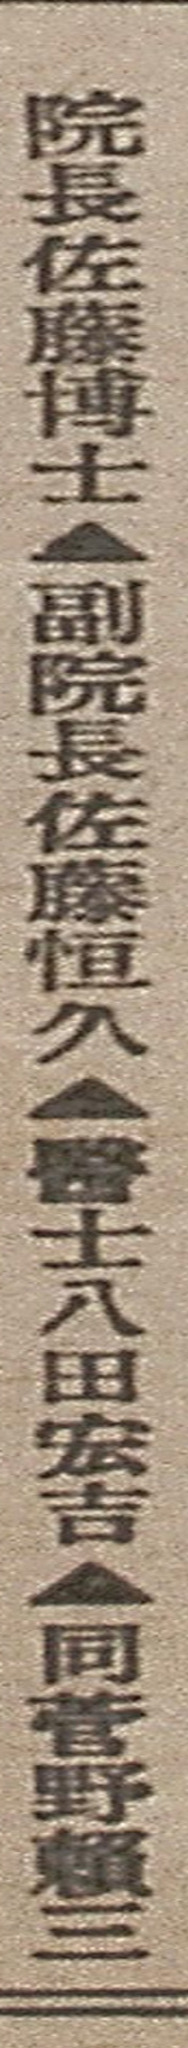院長佐藤博士▲副院長佐藤恒久▲医士八田宏吉▲同菅野頼三
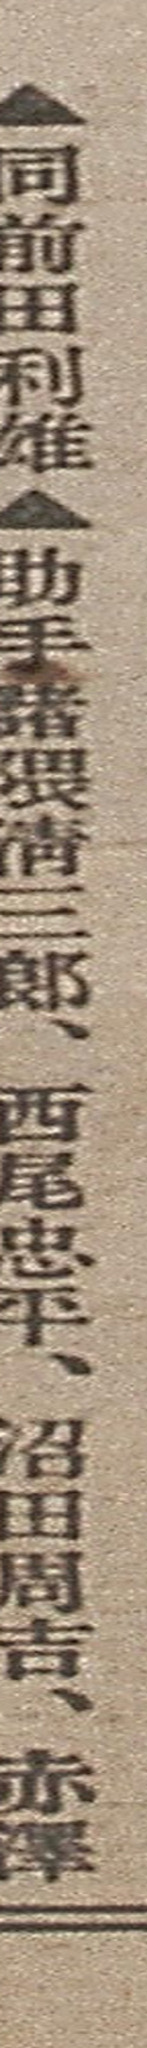▲同前田利雄▲助手諸隈清三郎、西尾忠平、沼田周吉、赤沢
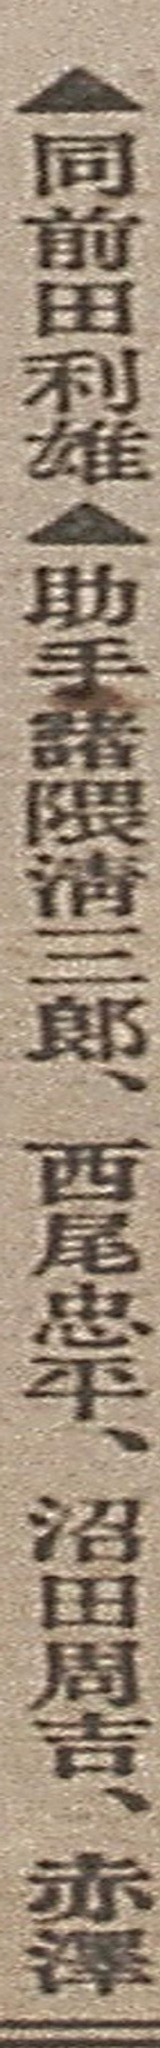▲同前田利雄▲助手諸隈清三郎、西尾忠平、沼田周吉、赤沢
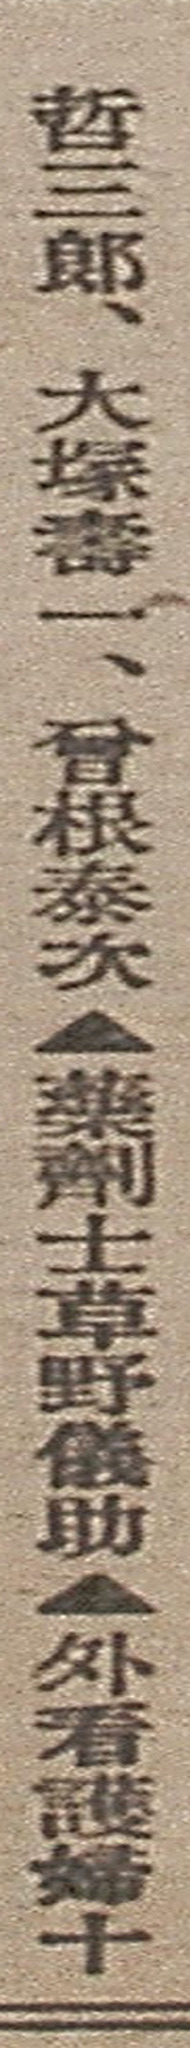哲三郎、大塚寿一、曽根泰次▲薬剤士草野儀助▲外看護婦十
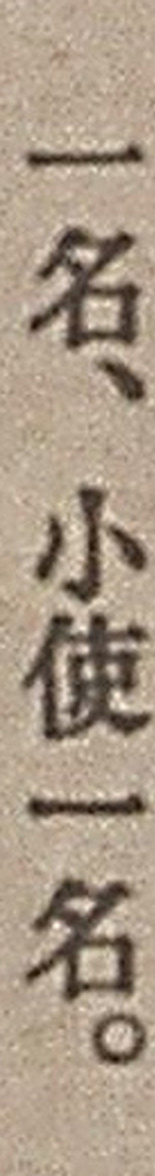一名、小使一名。
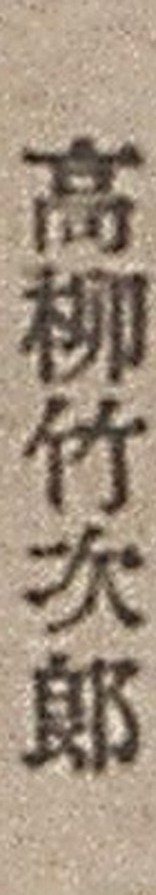高柳竹次郎
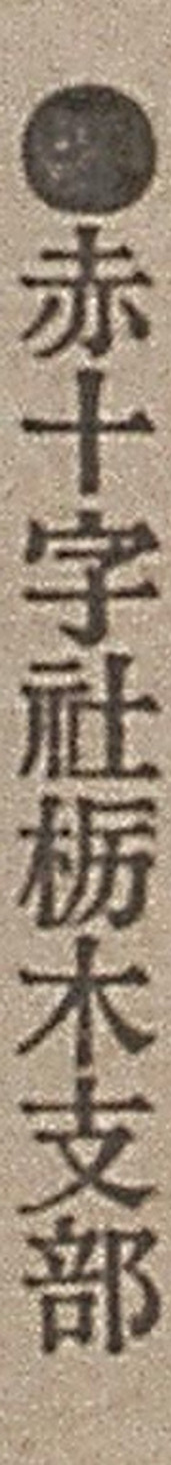●赤十字社栃木支部
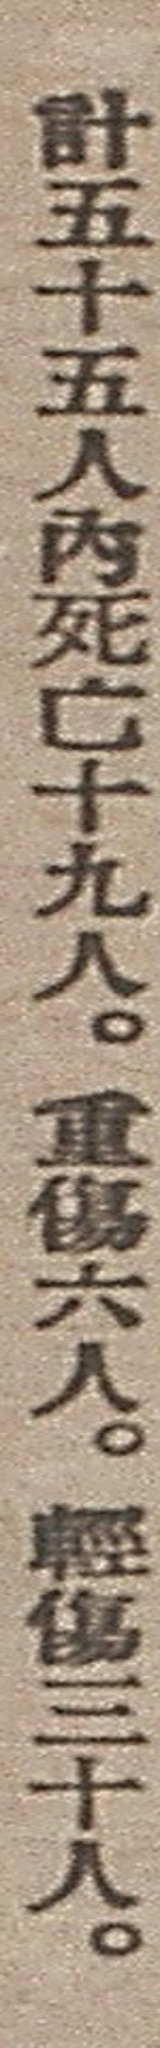計五十五人内死亡十九人。重傷六人。軽傷三十人。
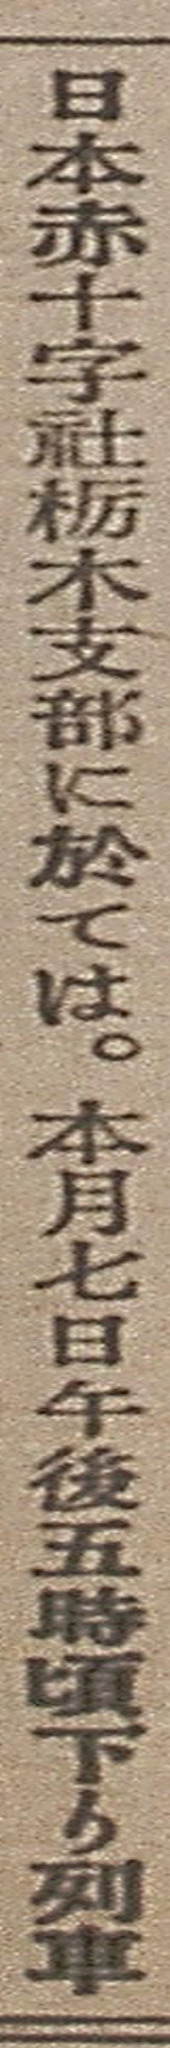日本赤十字社栃木支部に於ては。本月七日午後五時頃下り列車
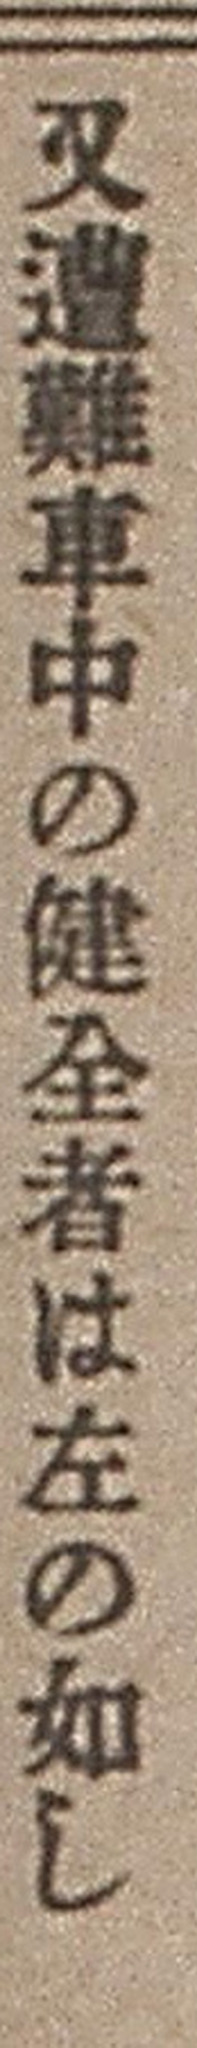又遭難車中の健全者は左の如し
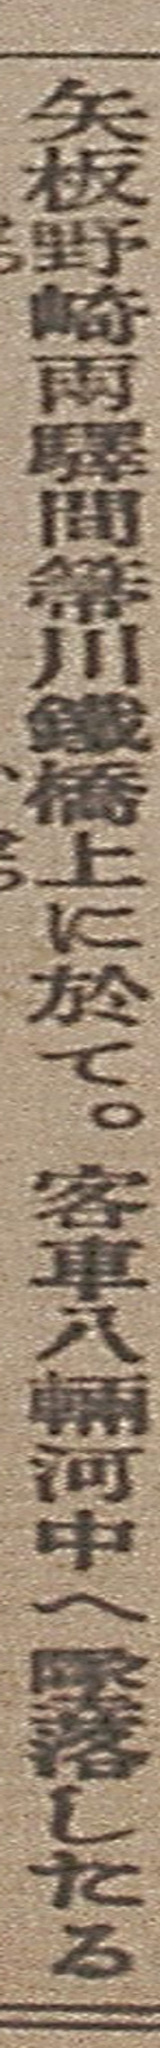矢板野崎両駅間箒川鉄橋上に於て。客車八輌河中へ墜落したる
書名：風俗畫報臨時増刊第百九十九號　明治三十二年十月各地災害圖會（前編之續）
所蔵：東京大学地震研究所図書室 Earthquake Research Institute Library, The University of Tokyo, JAPAN
